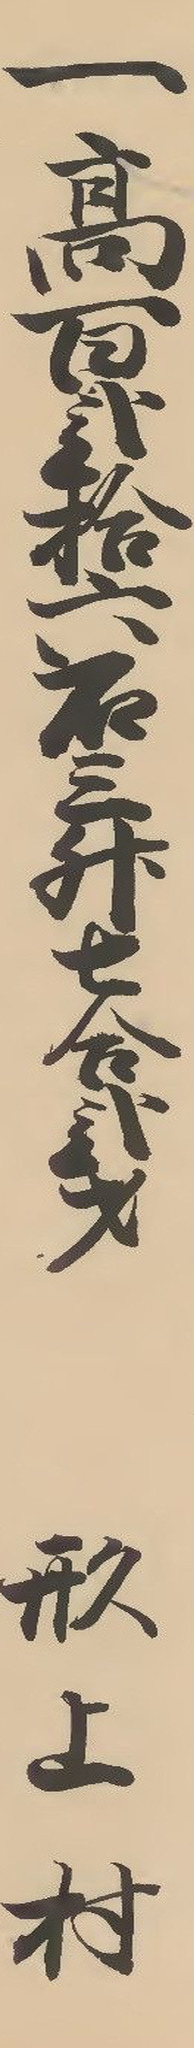一髙百弐拾六石三升七合弐才形上村
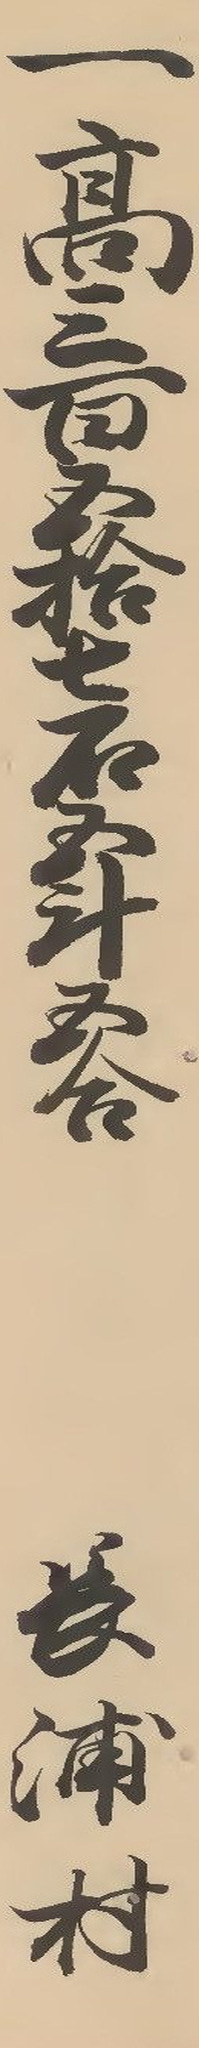一髙三百五拾七石五斗五合長浦村
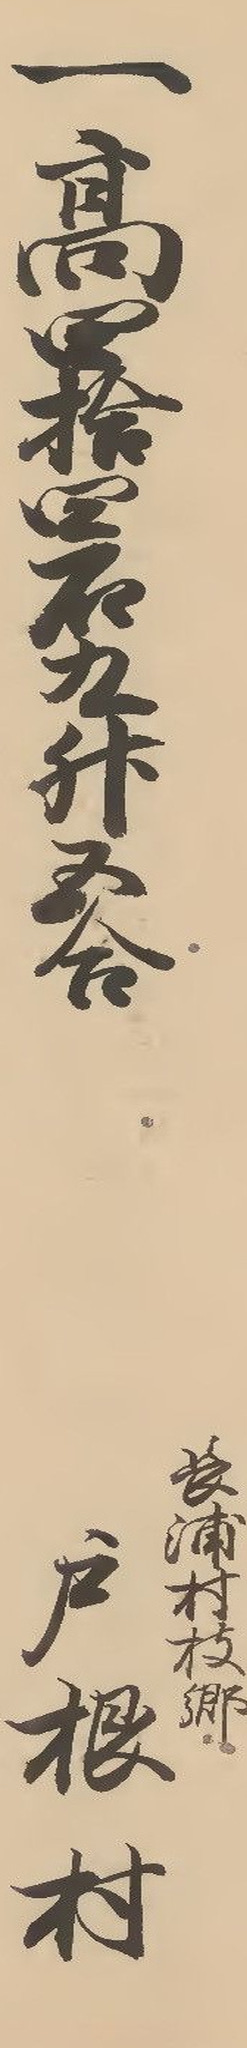一髙四拾四石九升五合戸根村
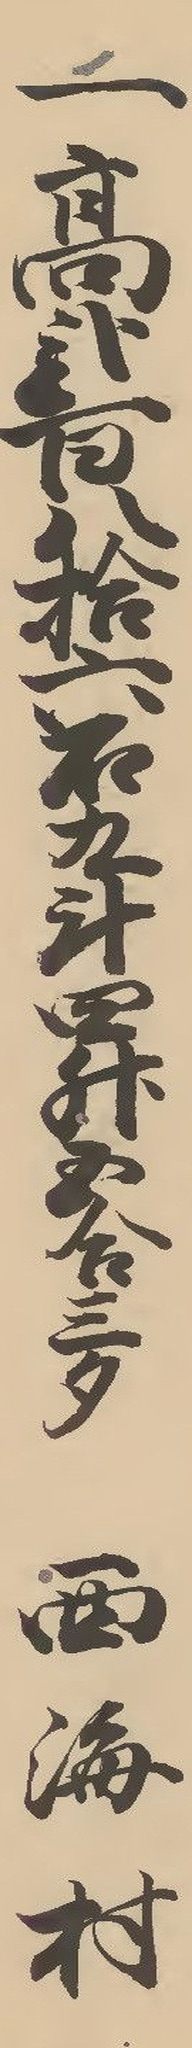一髙弐百八拾六石九斗四升五合三夕西海村

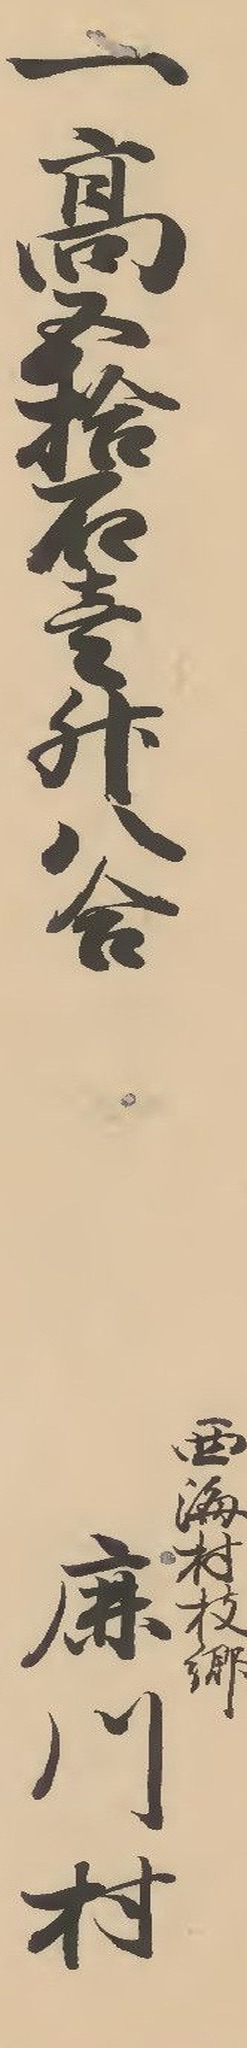一髙五拾石壱升八合鹿川村
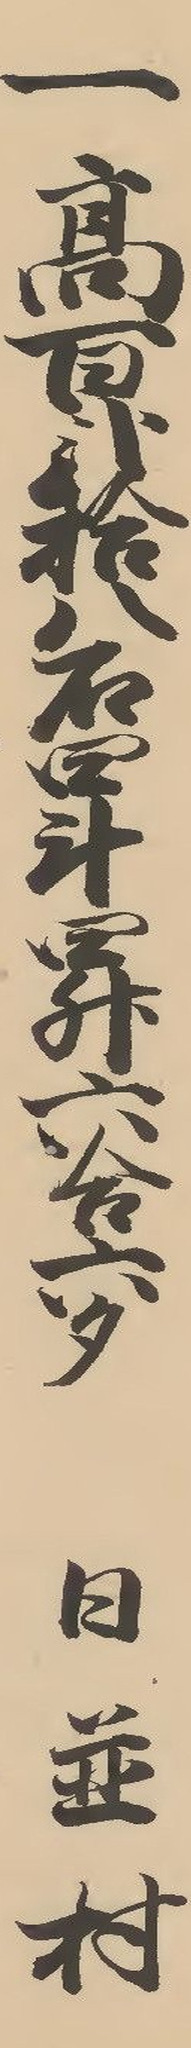一髙百弐拾八石四斗四升六合六夕日並村
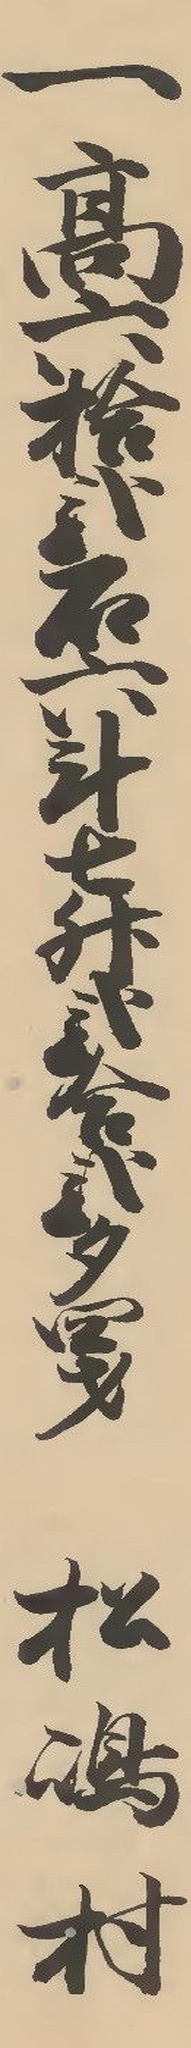一髙六拾弐石六斗七升弐合弐夕四才松島村
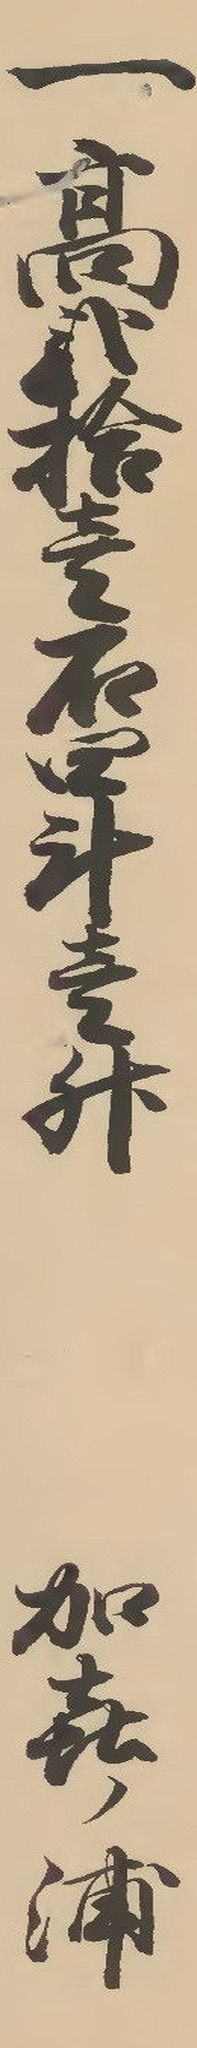一髙弐拾壱石四斗壱升加喜ノ浦
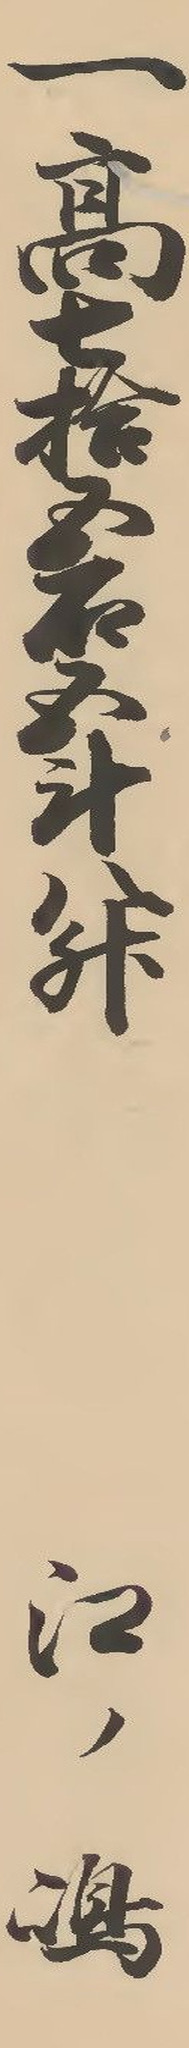一髙七拾五石五斗八升江ノ嶋
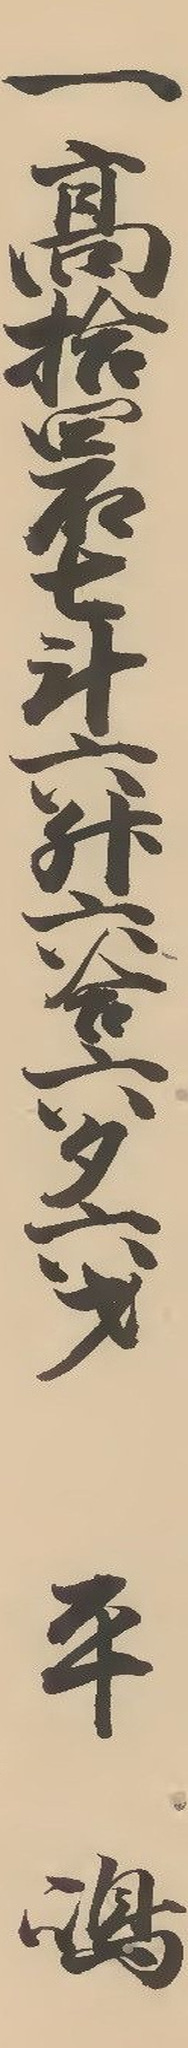一髙拾四石七斗六升六合六夕六才平嶋
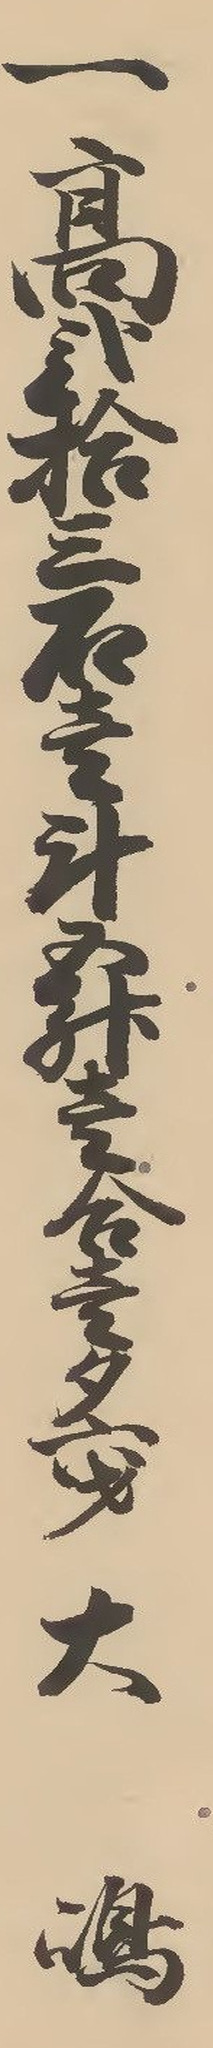一髙弐拾三石壱斗五升壱号壱夕六才大嶋
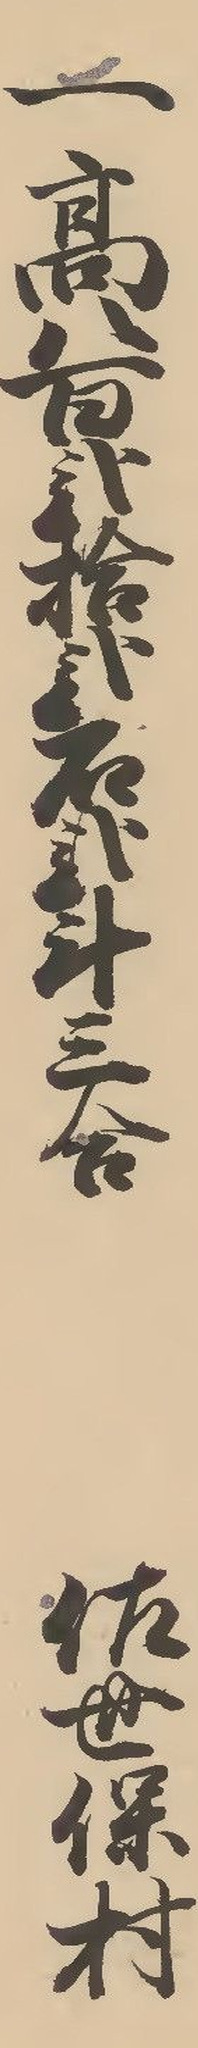一髙八百弐拾弐石弐斗三合佐世保村

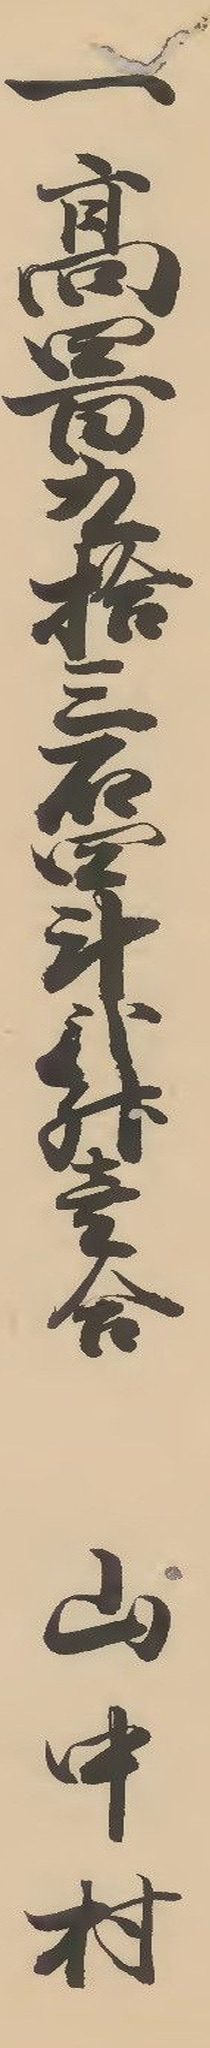一髙四百九拾三石四斗弐升壱合山中村
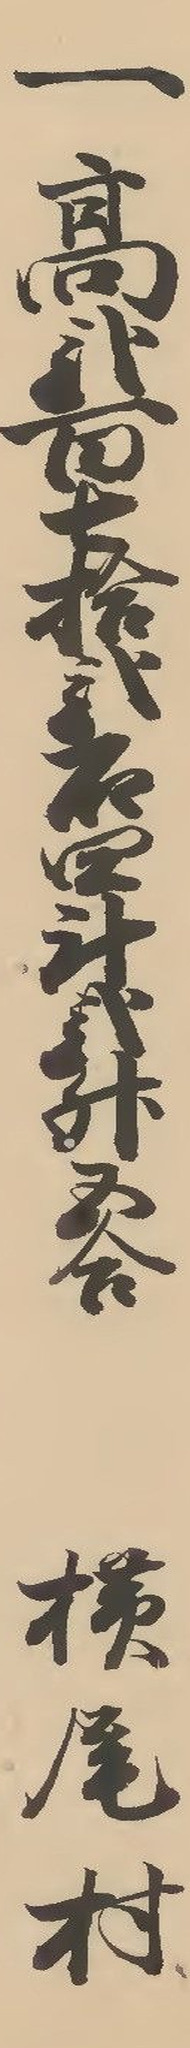一髙弐百七拾弐石四斗弐升五合横尾村
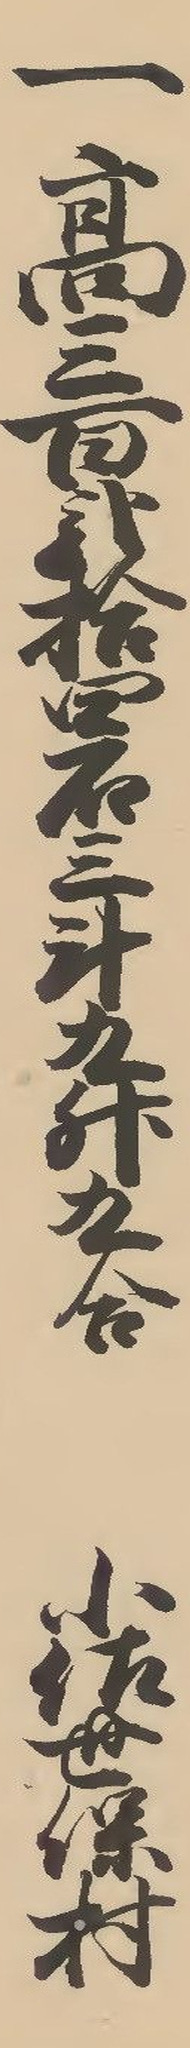一髙三百弐拾四石三斗九升九合小佐世保村
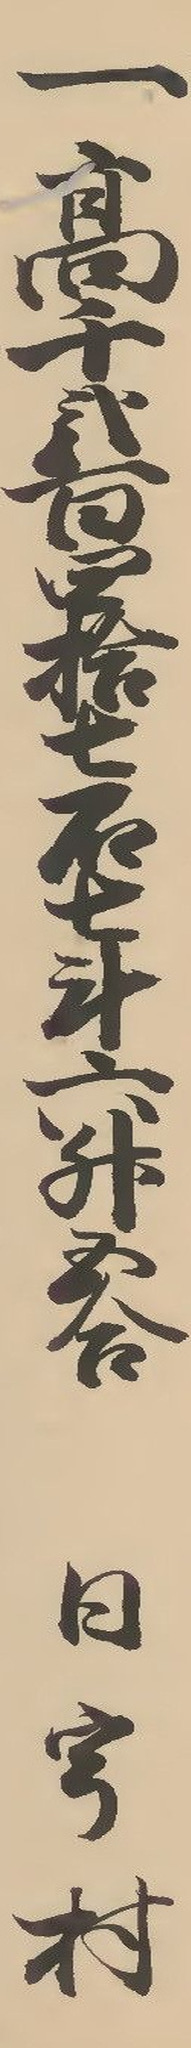一髙千弐百四拾七石七斗六升五合日宇村
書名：肥前国郷帳
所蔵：国立公文書館 National Archives of Japan
